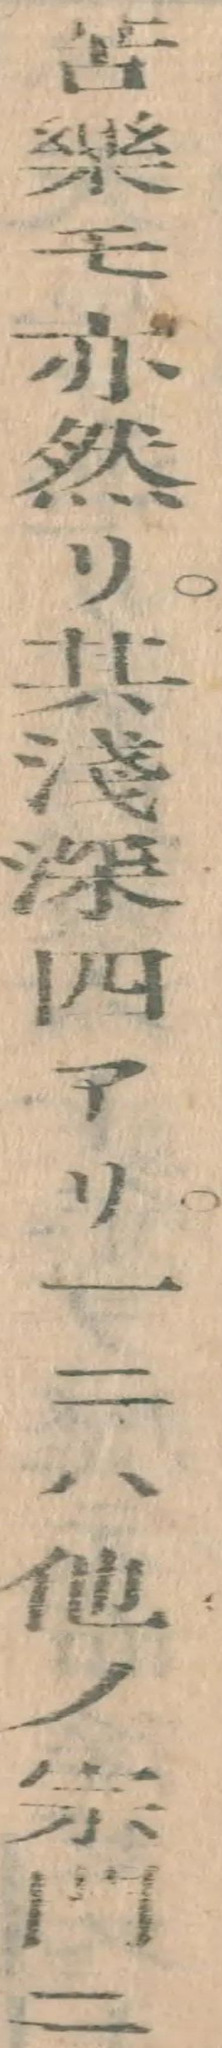苦楽モ亦然リ。共浅深四アリ。一ニハ他ノ宗門ニ
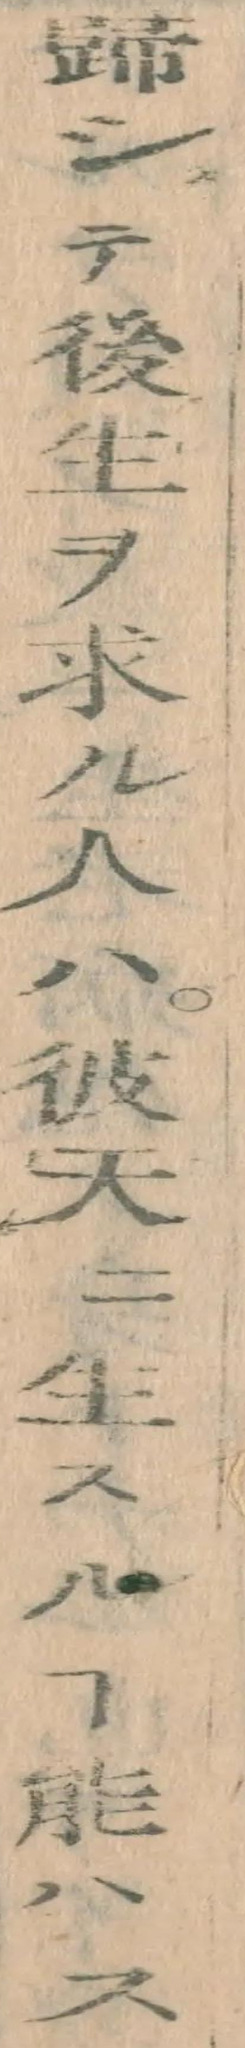帰シテ後生ヲ求ル人ハ。彼天ニ生スルヿ能ハス
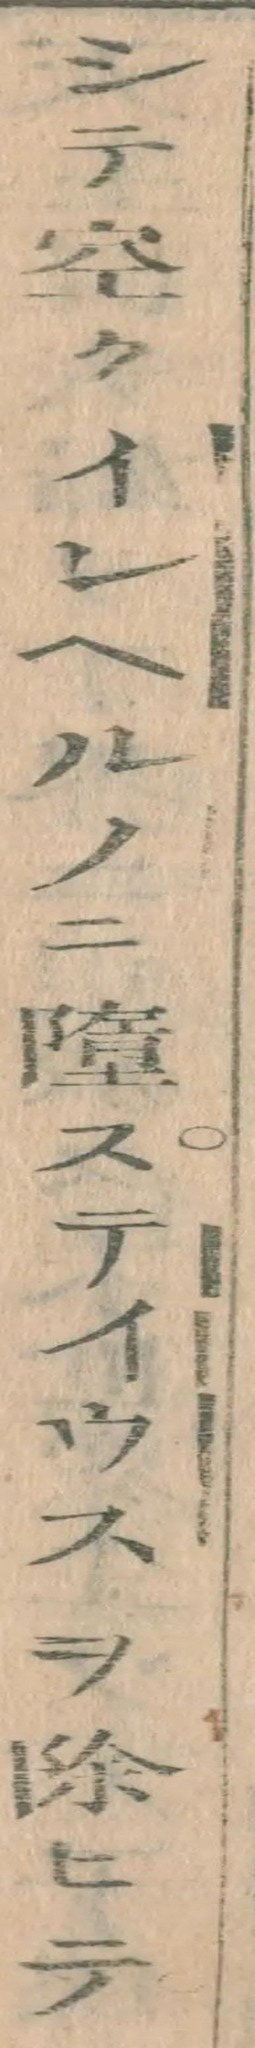シテ空クインヘルノニ堕ス。テイウスヲ除ヒテ
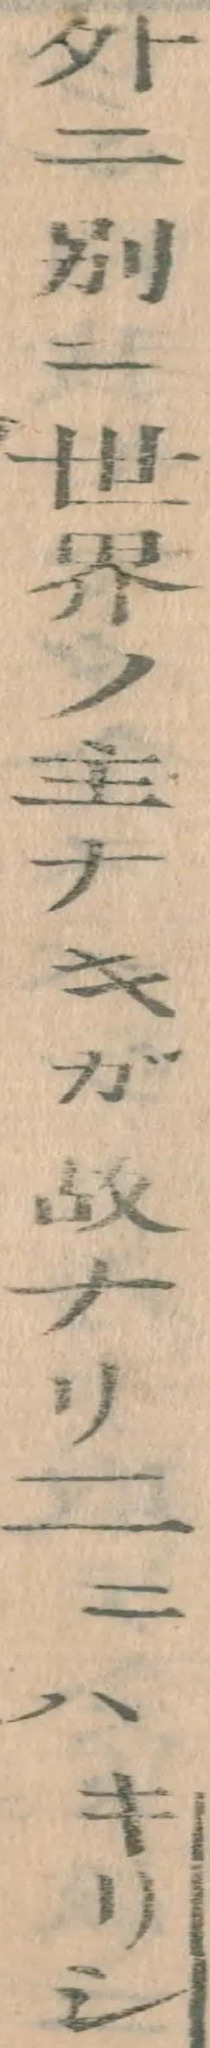外ニ別ニ世界ノ主ナキガ故ナリ二ニハキリシ
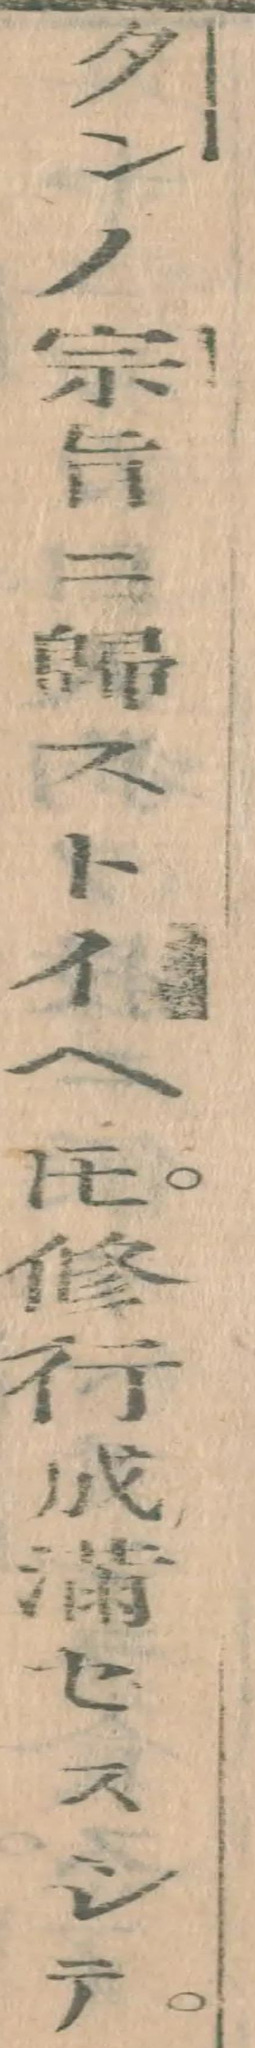タンノ宗旨ニ帰ストイヘトモ。修行成満セスシテ。
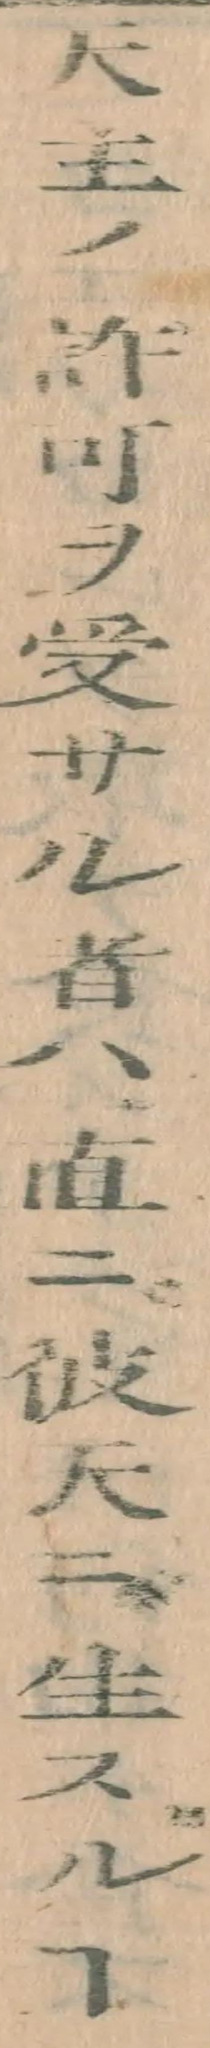天主ノ許可ヲ受サル者ハ直ニ彼天ニ生スルヿ
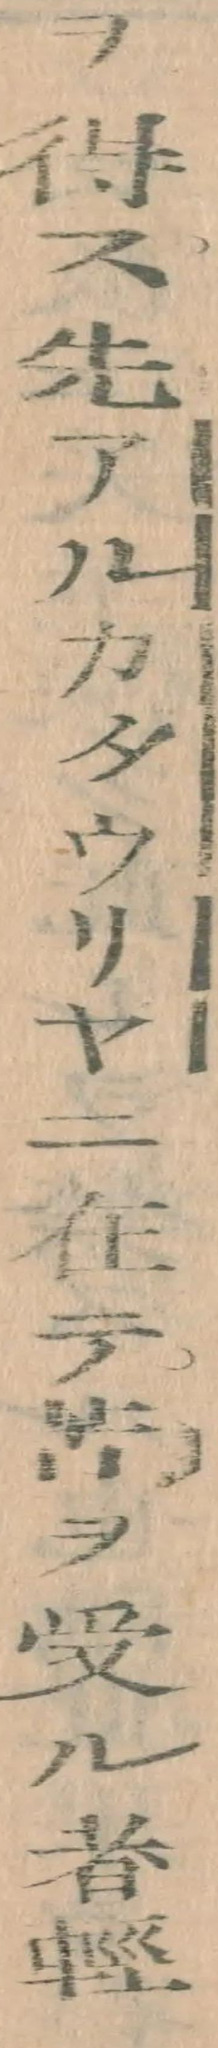ヲ得ス。先アルカタウリヤニ在テ。苦ヲ受ル者軽
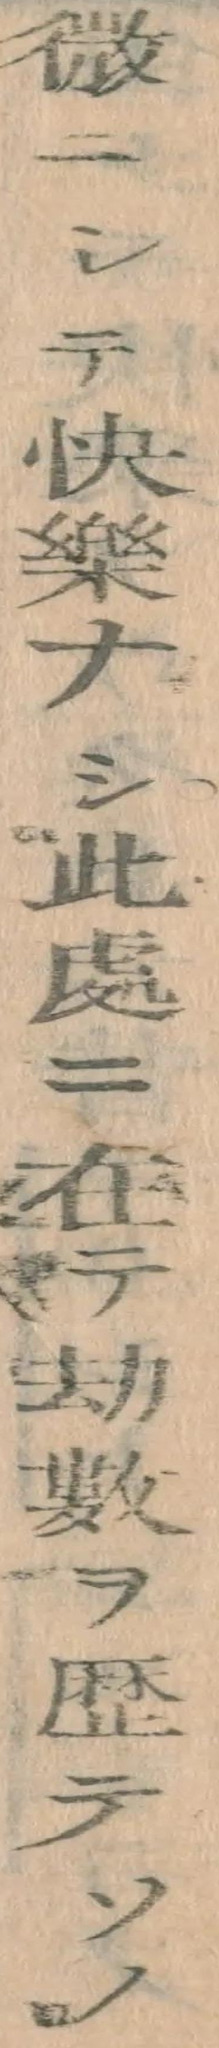微ニシテ快楽ナシ。此処ニ在テ劫数ヲ歴テソノ
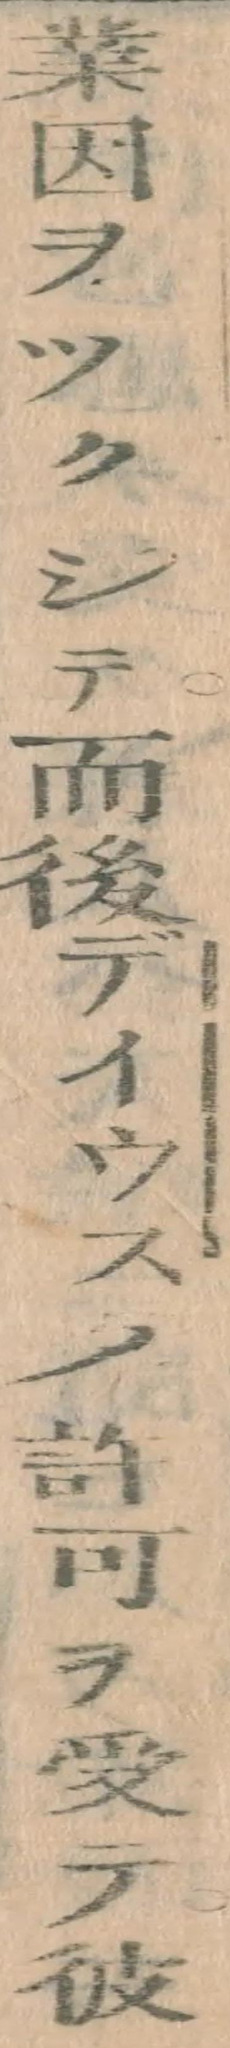業因ヲツクシテ。而後デイウスノ許可ヲ受テ。彼
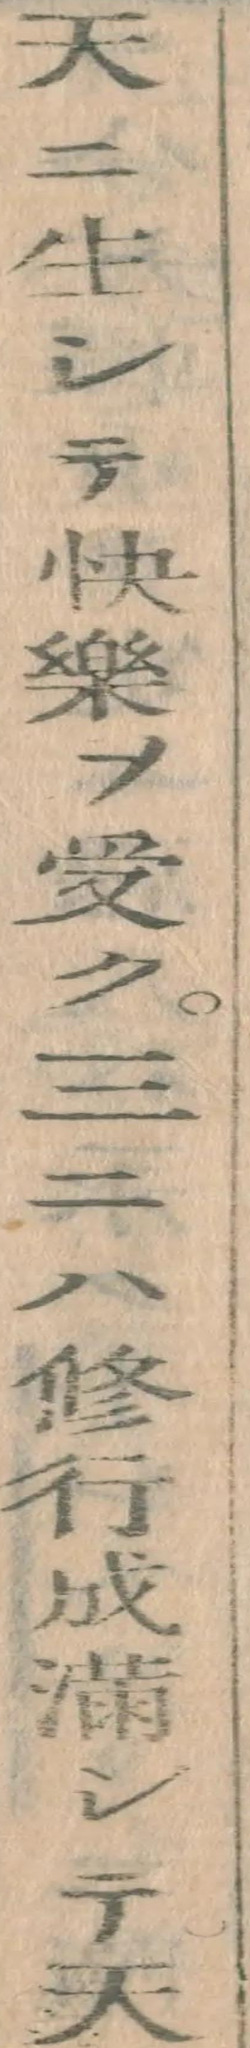天ニ生シテ快楽ヲ受ク。三ニハ修行成満シテ。天
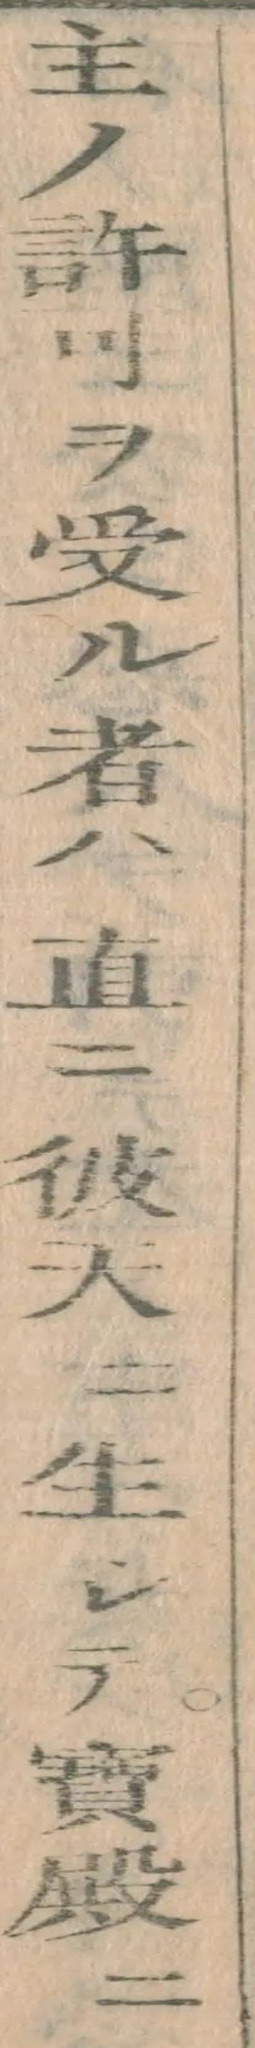主ノ許可ヲ受ル者ハ直ニ彼天ニ生シテ。宝殿ニ
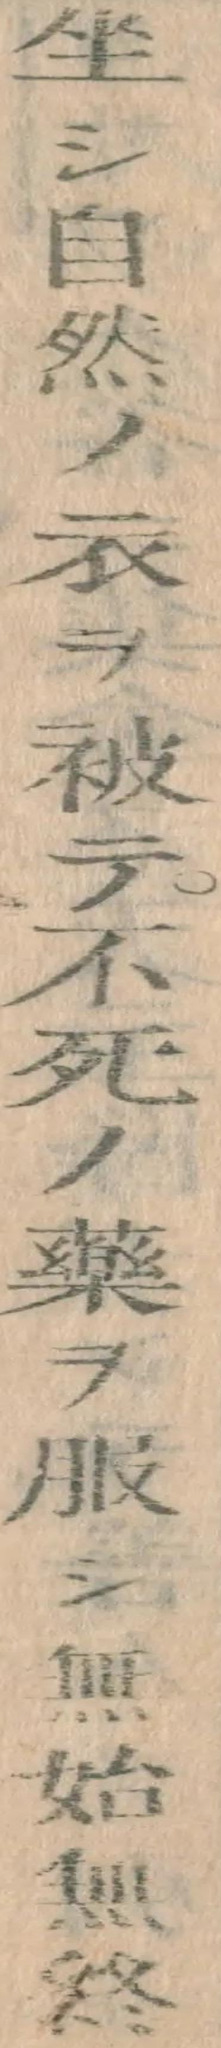坐シ自然ノ衣ヲ被テ。不死ノ薬ヲ服シ無始無終
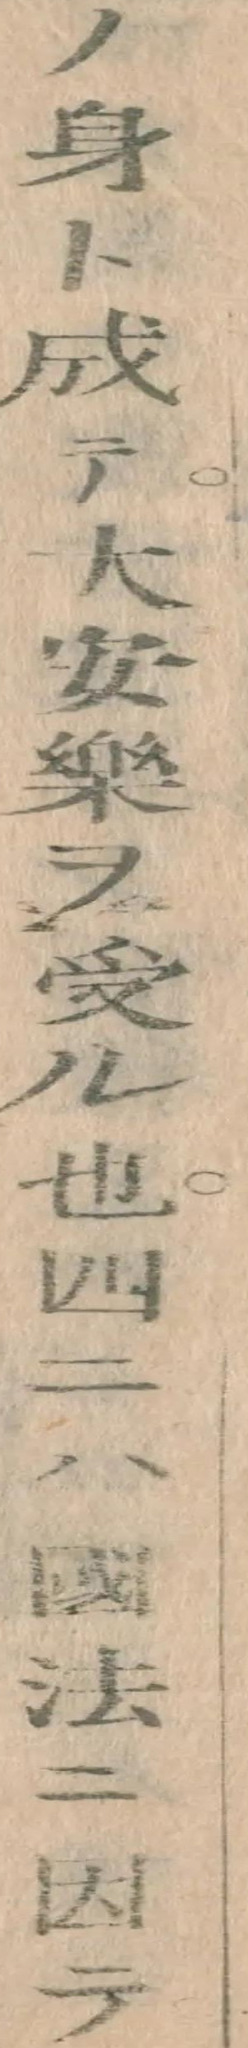ノ身ト成テ。大安楽ヲ受ル也。四ニハ国法ニ因テ
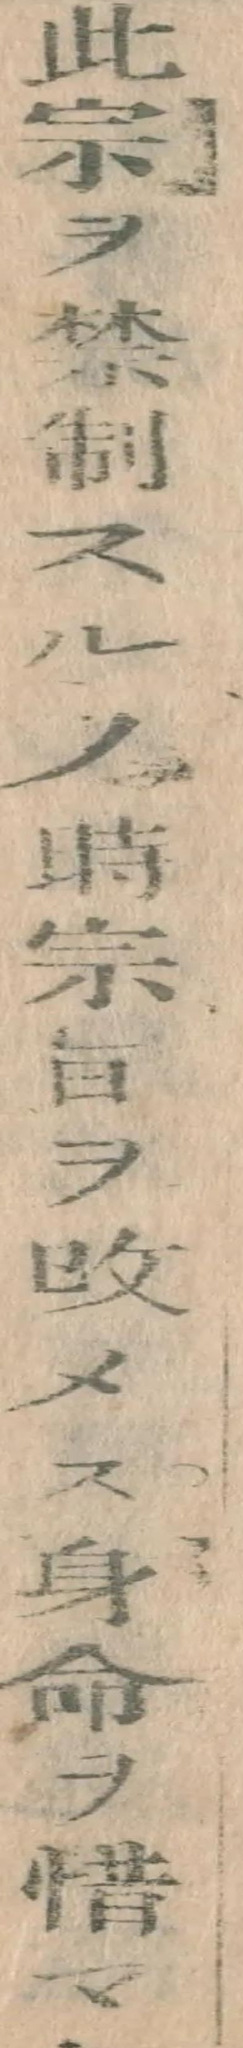此宗ヲ禁制スルノ時宗旨ヲ改メス。身命ヲ惜マ
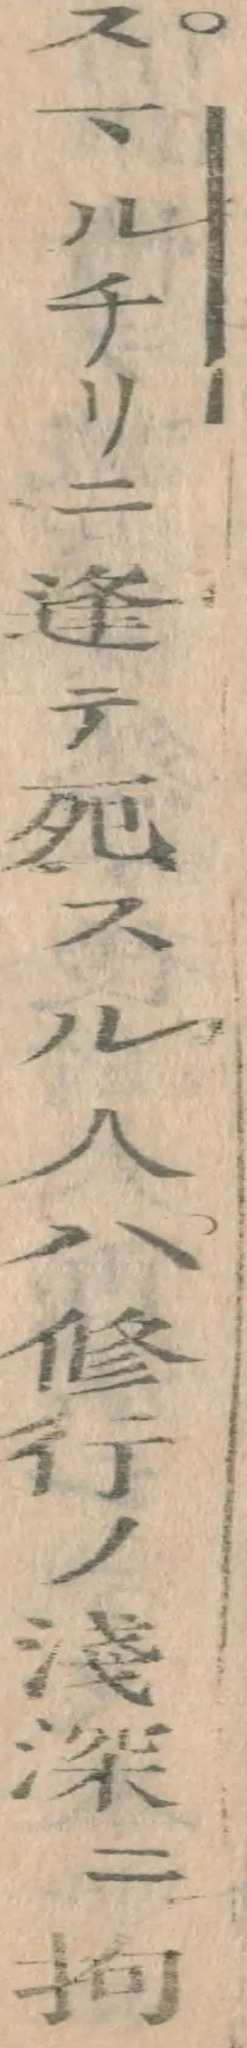ス。マルチリニ逢テ死スル人ハ。修行ノ浅深ニ拘
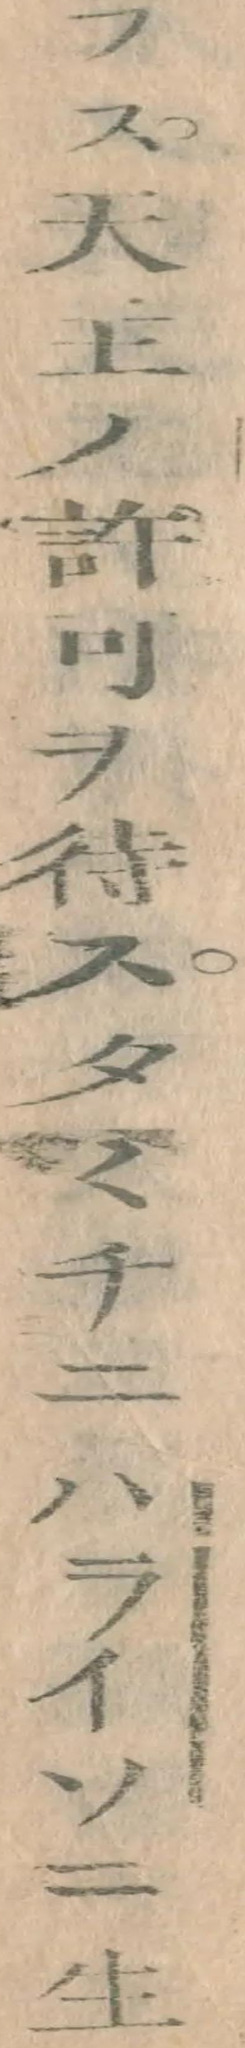ラス。天主ノ許可ヲ待ス。タ〱チニハライソニ生
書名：南蛮寺興廃記
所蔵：国立国会図書館 National Diet Library, JAPAN
